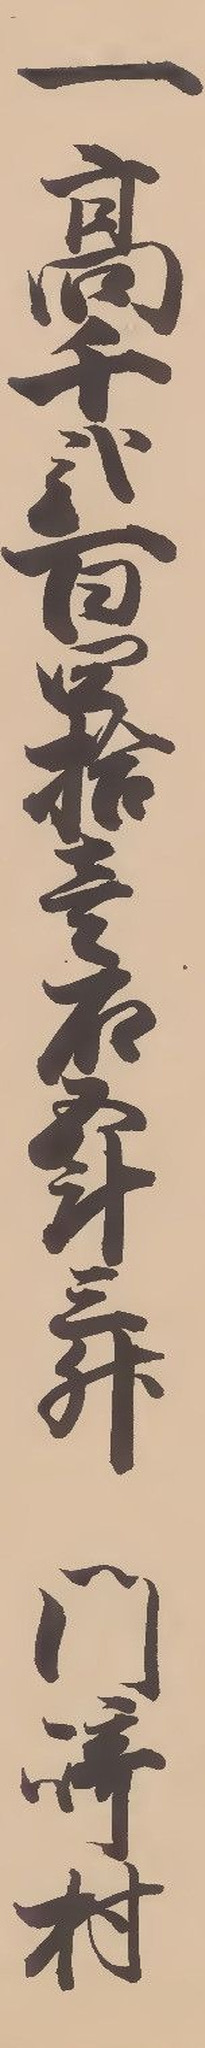一高千弐百四拾壱石五斗三升門崎村
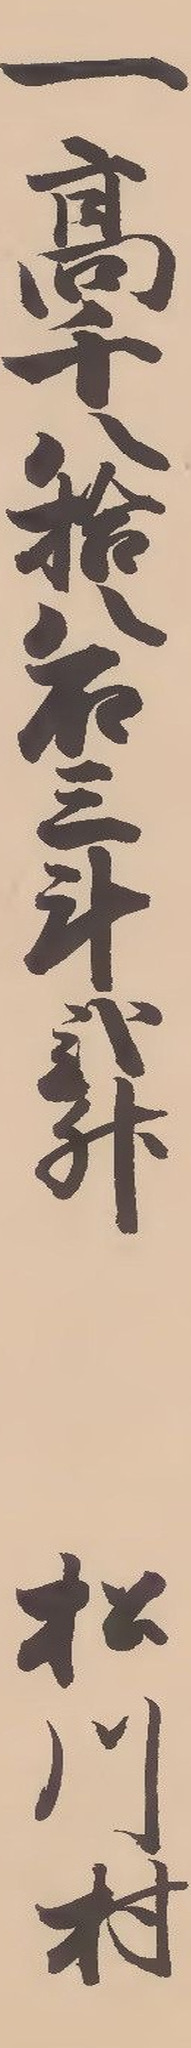一高千八拾八石三斗弐升松川村
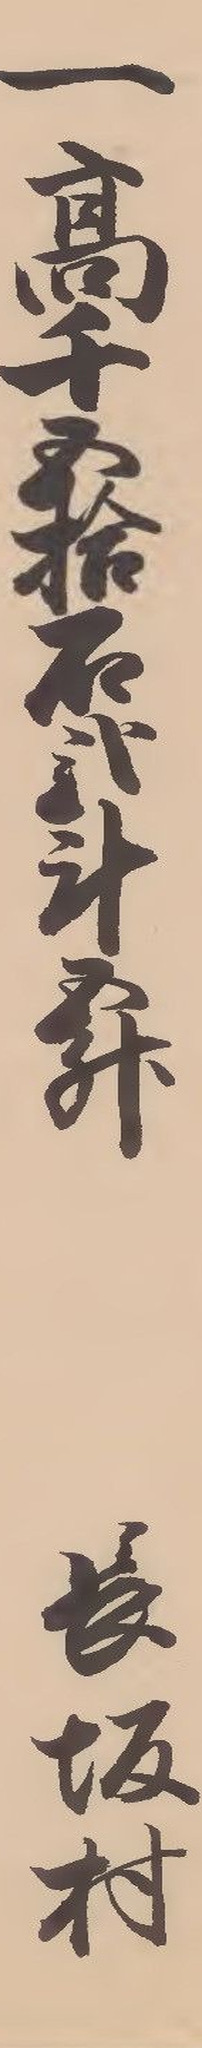一高千五拾石弐斗五升長坂村
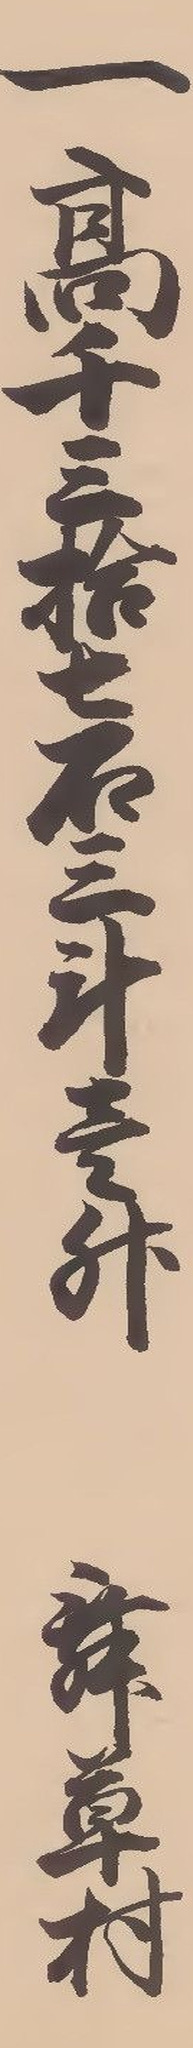一高千三拾七石三斗壱升舞草村
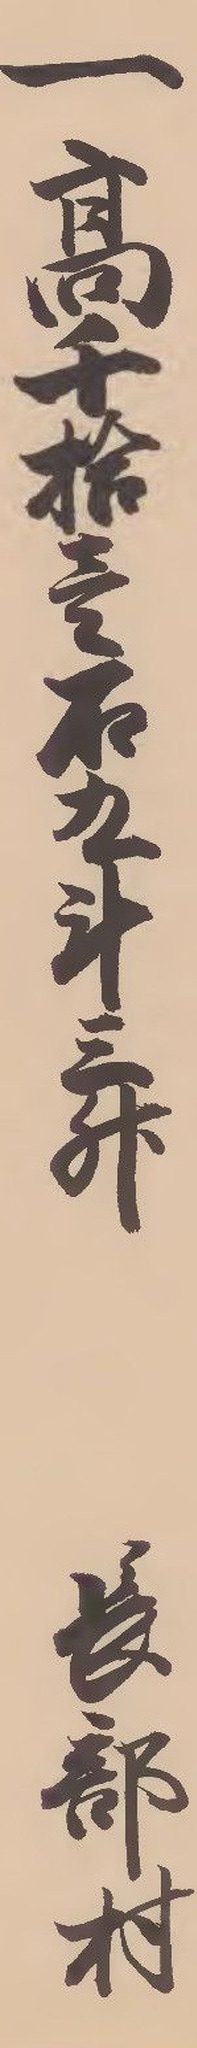一高千拾壱石九斗三升長部村

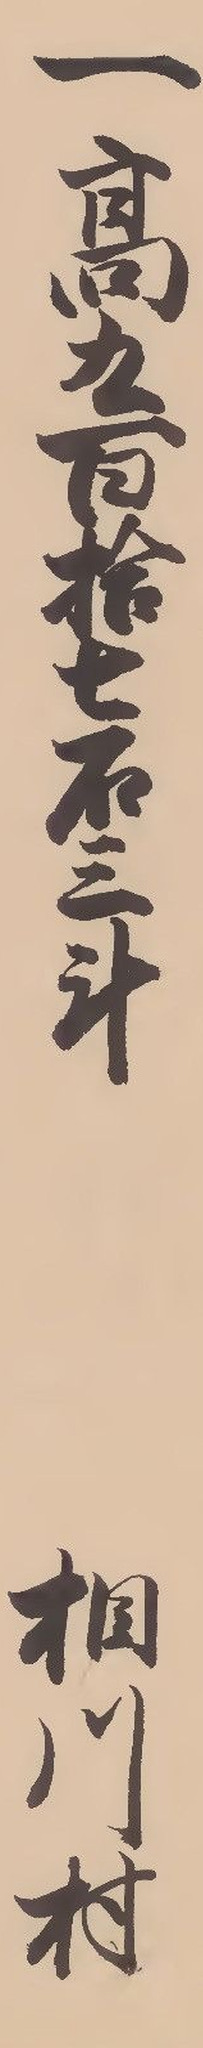一高九百拾七石三斗相川村
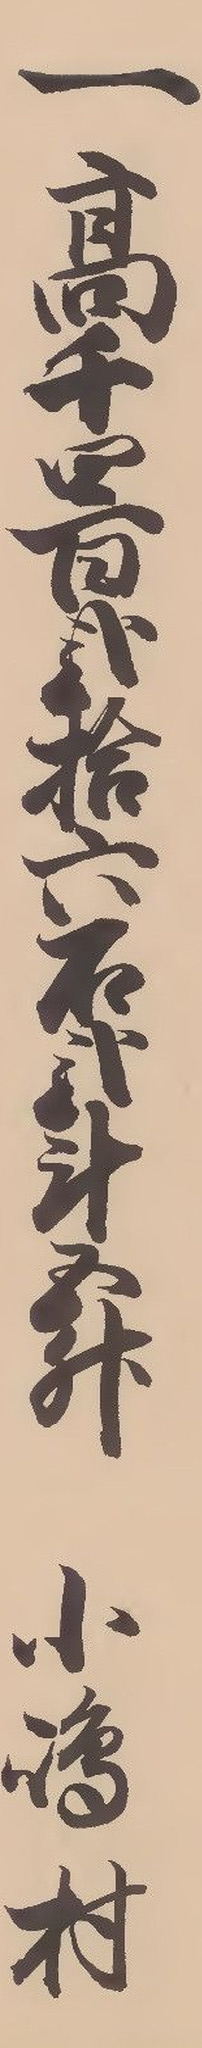一高千四百弐拾六石弐斗五升小島村
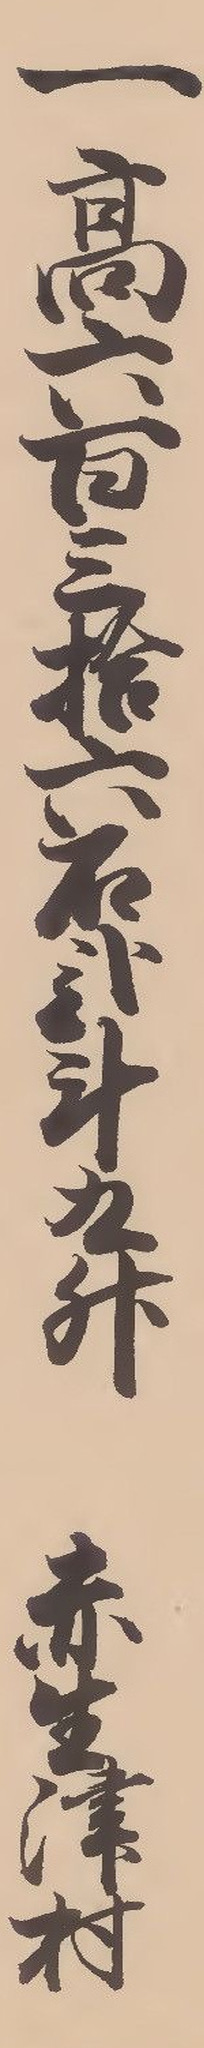一高六百三拾六石弐斗九升赤生津村
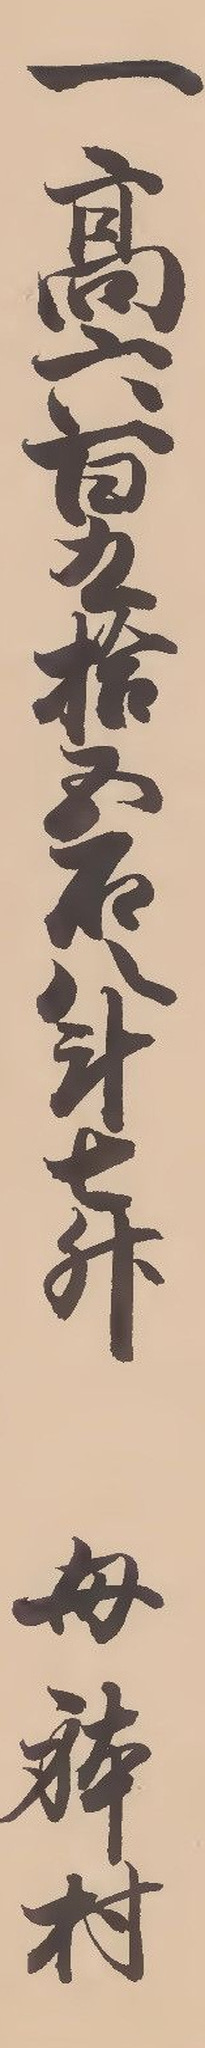一高六百九拾五石八斗七升母躰村
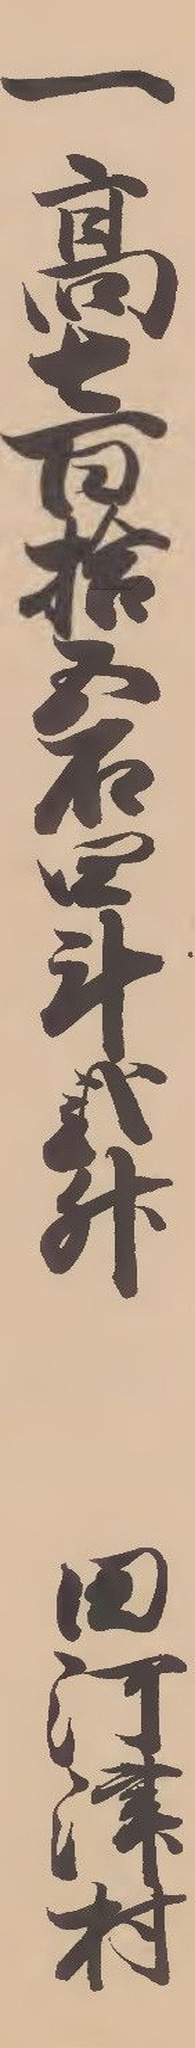一高七百拾五石四斗弐升田河津村
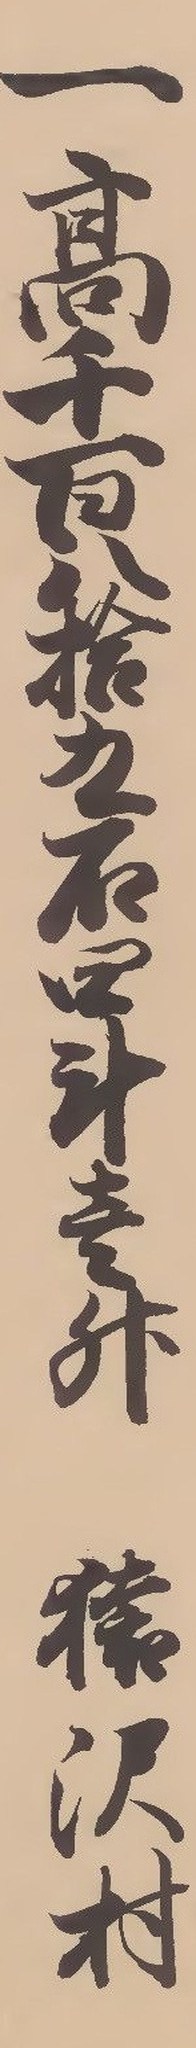一高千百八拾九石四斗壱升猿沢村
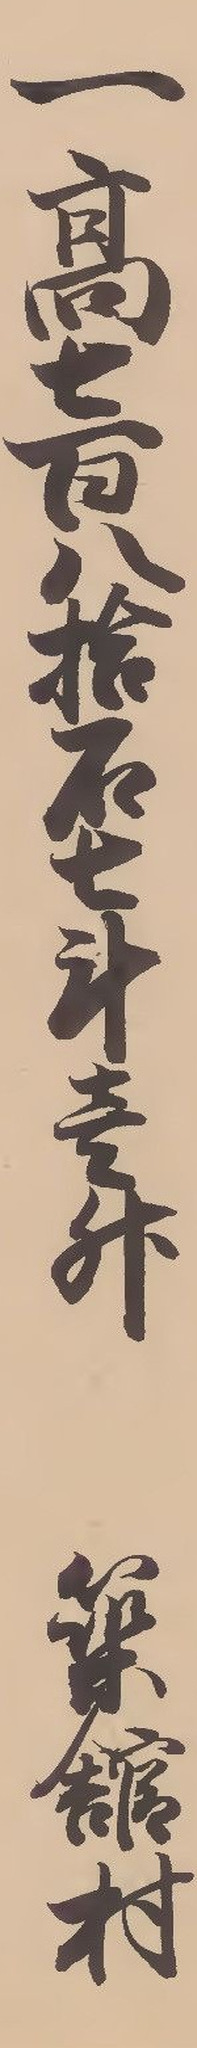一高七百八拾石七斗壱升築舘村
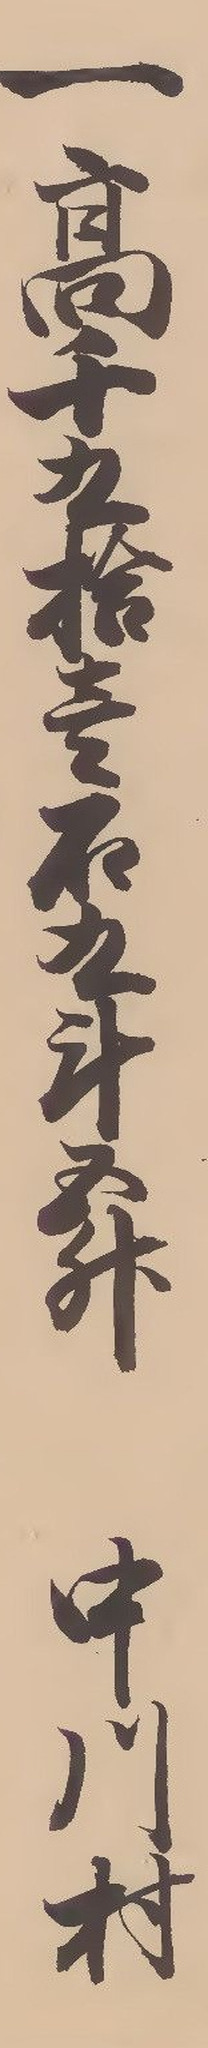一高千九拾壱石九斗五升中川村

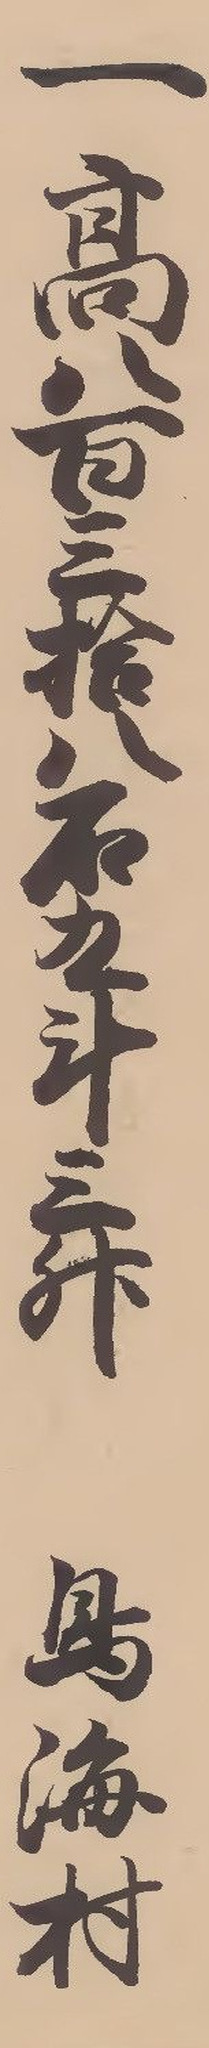一高八百三拾八石九斗三升鳥海村
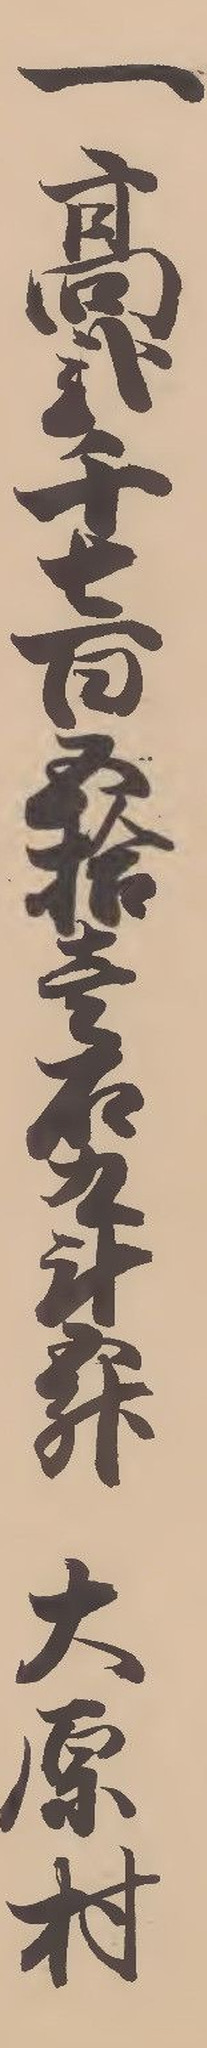一高弐千七百五拾壱石九斗五升大原村
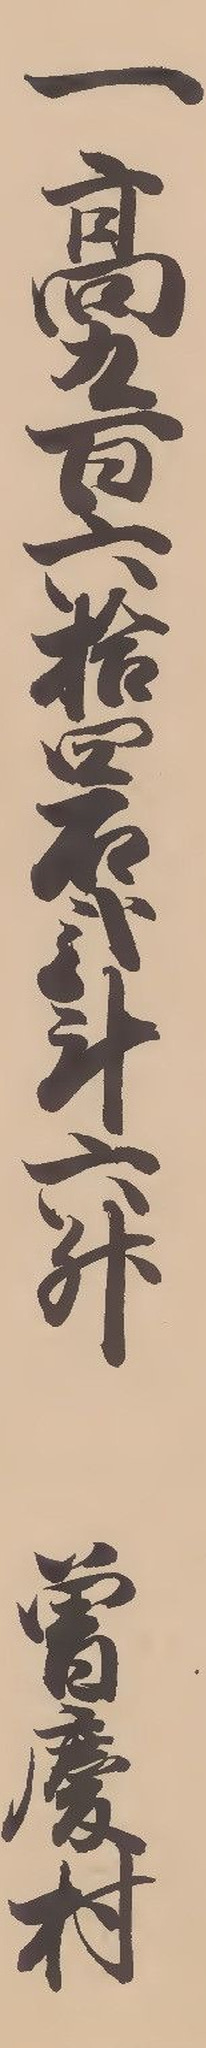一高九百六拾四石弐斗六升曽慶村
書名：陸奥国郷帳　５
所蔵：国立公文書館 National Archives of Japan
